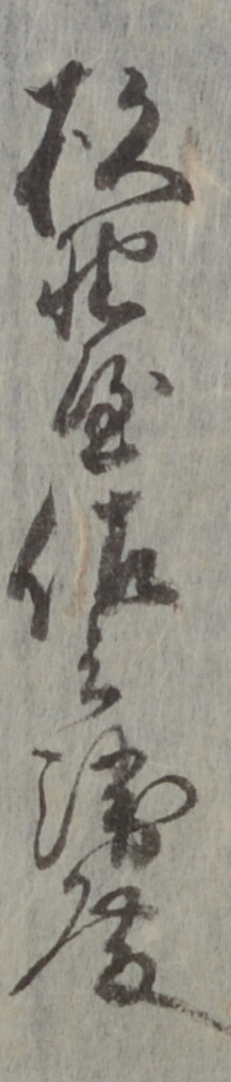杉野屋佐兵衛殿
